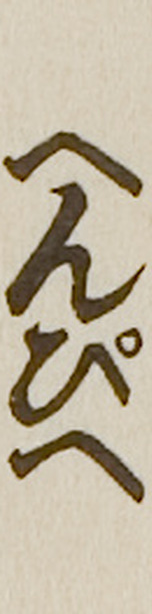へんぴへ
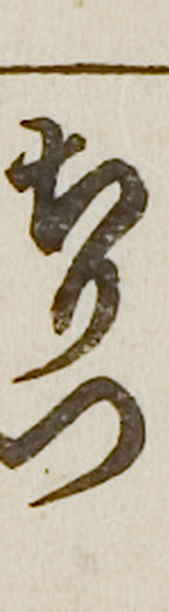ちりつ
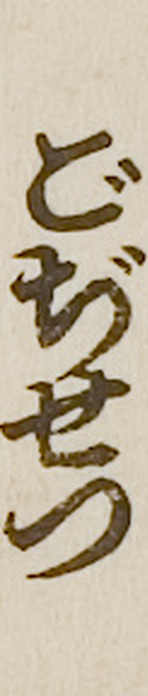ごぢせつ
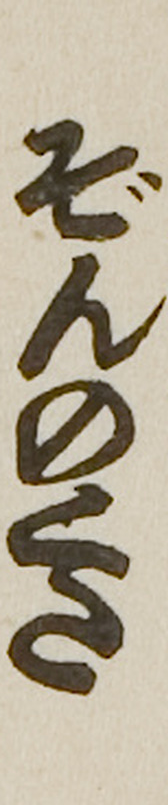ぞんのくた
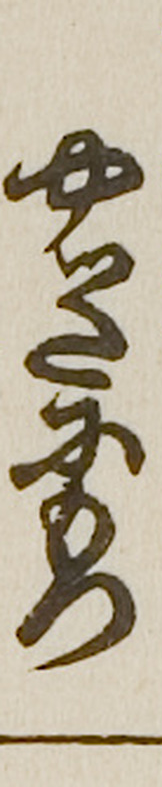やったにもつ
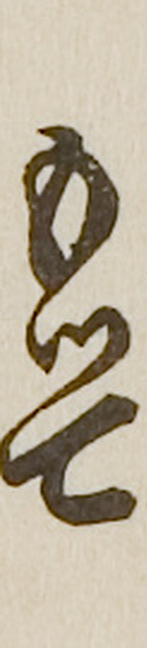もって
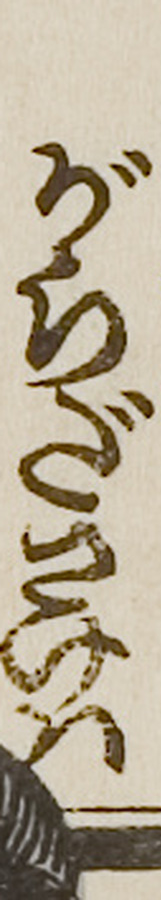がらださけは
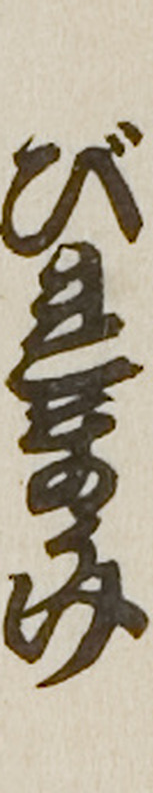びれまうけ
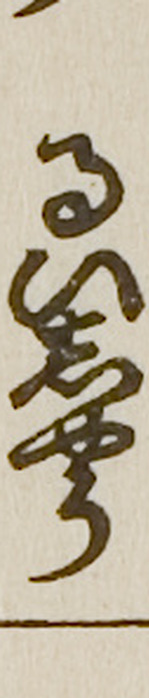るいしやう
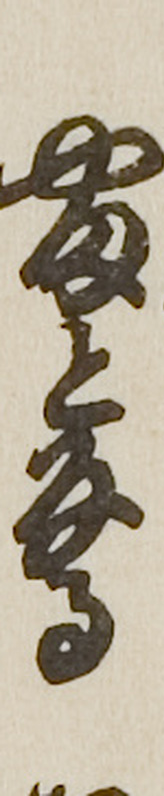やまとなる
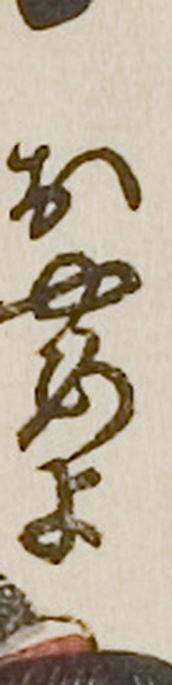おやめよ
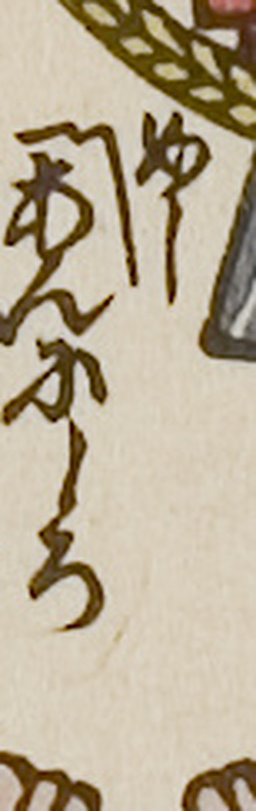〽あんにしろ
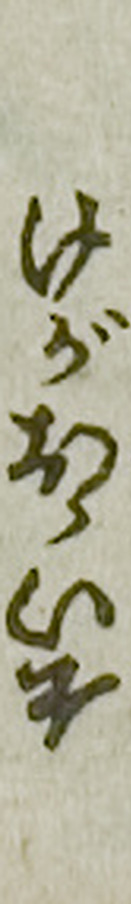けがおゝいそ
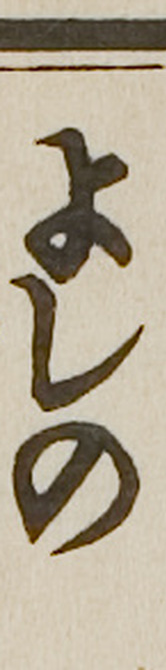よしの
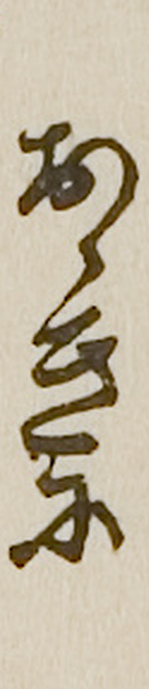おゝきな
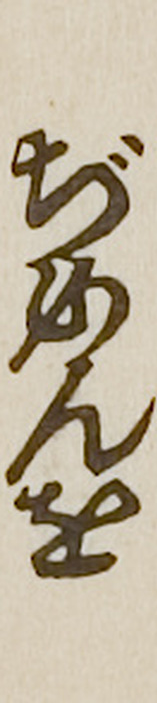ぢめんを
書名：当時流行いろは壁
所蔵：東京大学総合図書館 General Library in the University of Tokyo, JAPAN
